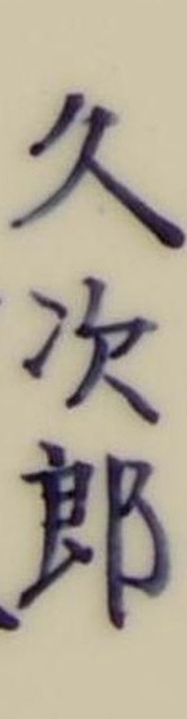久次郎

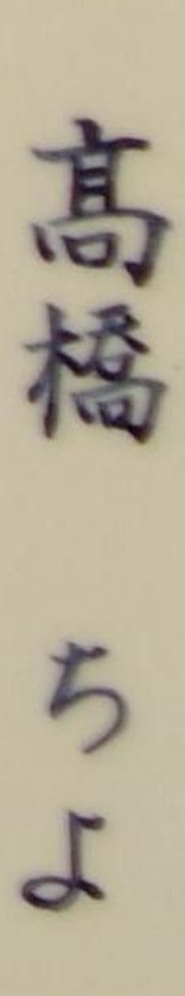高橋ちよ
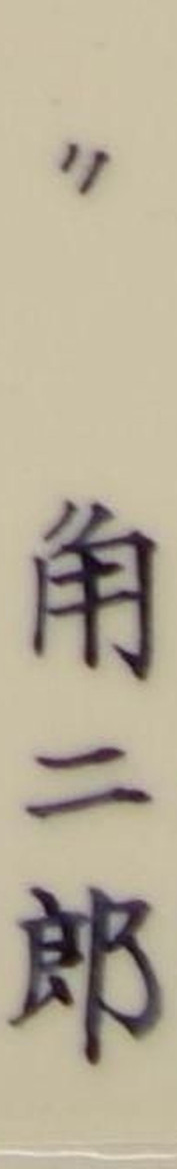角二郎
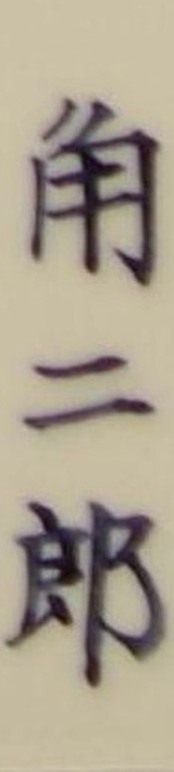角二郎
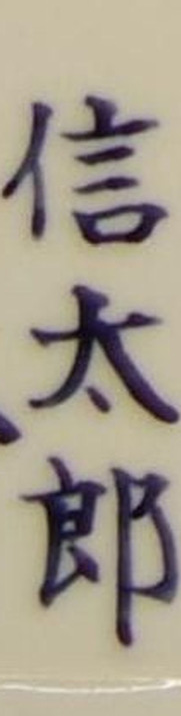信太郎

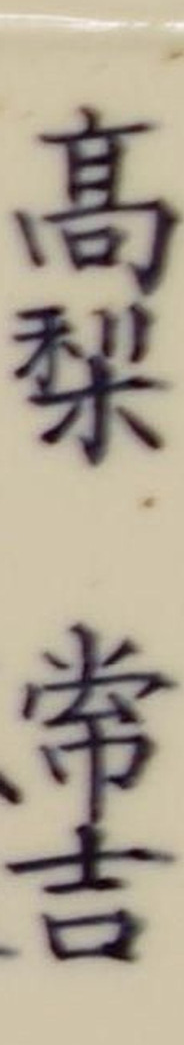高梨常吉
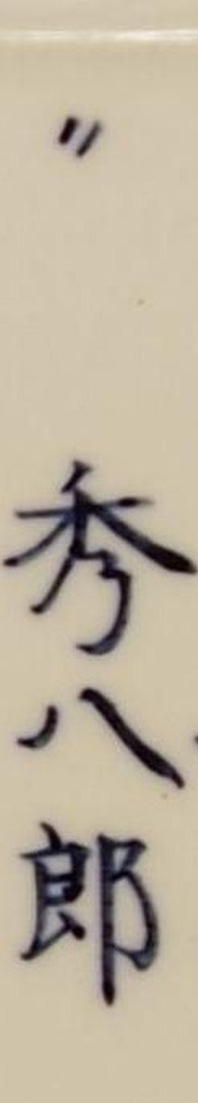秀八郎
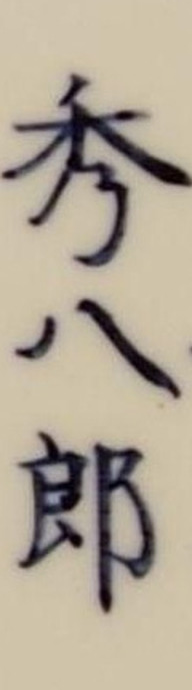秀八郎
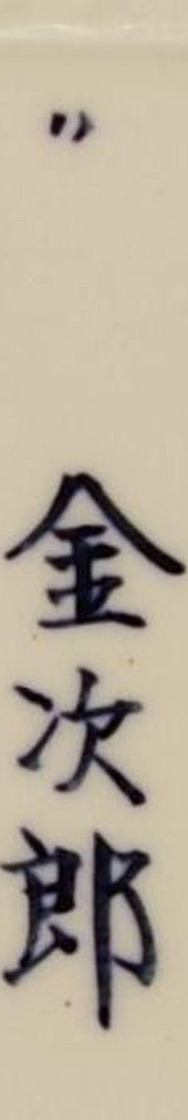金次郎
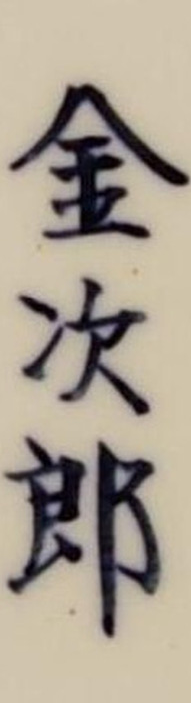金次郎
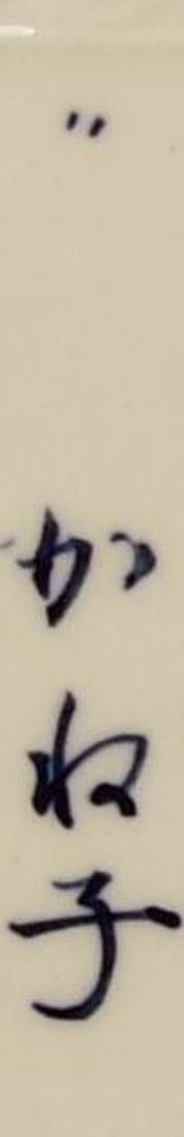かね子
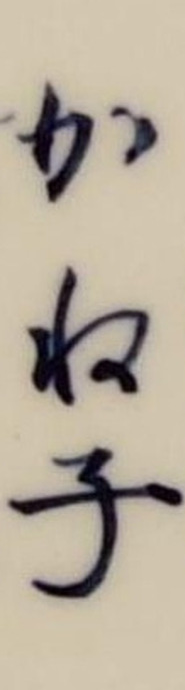かね子
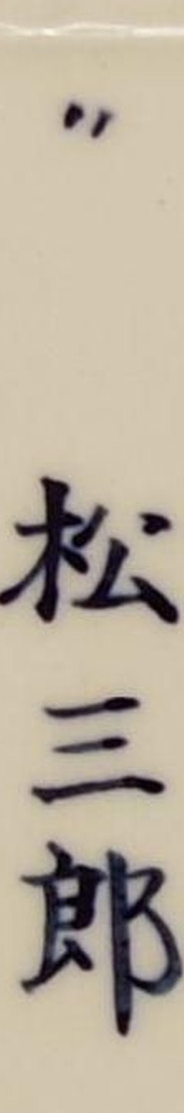松三郎
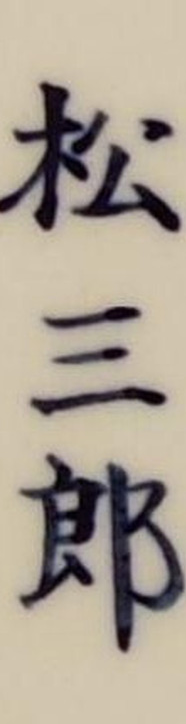松三郎
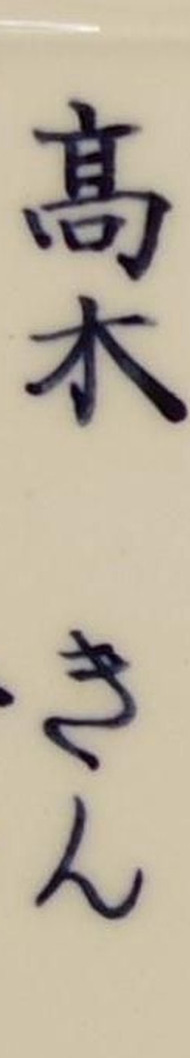高木きん
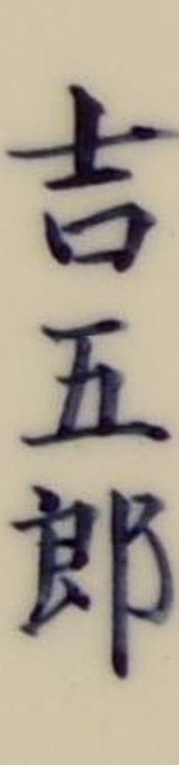吉五郎
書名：E~L
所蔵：高野山金剛峯寺
